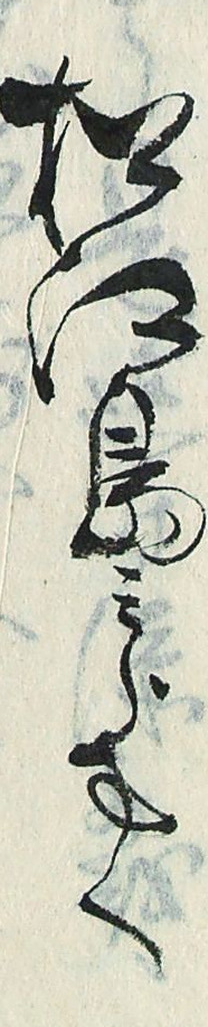松江島三郎方へ
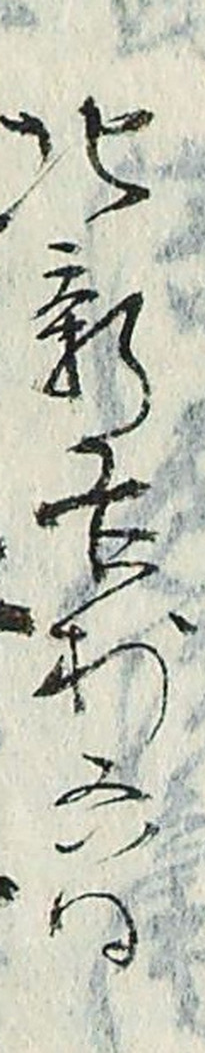北新居村右同
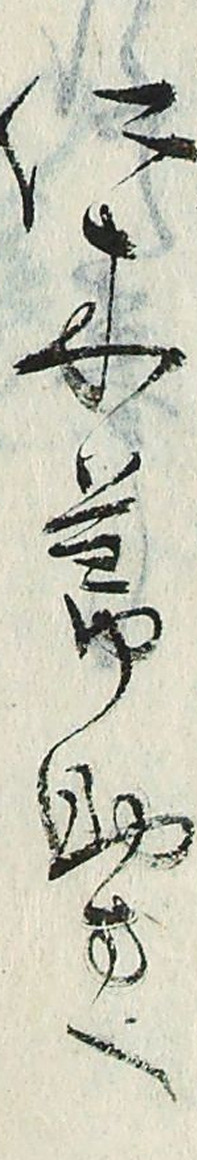仁木節助方へ
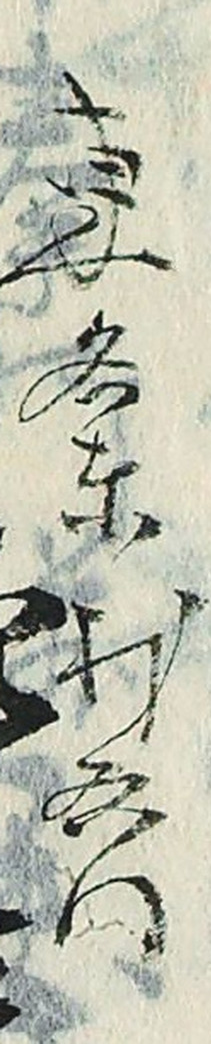東名東村右同
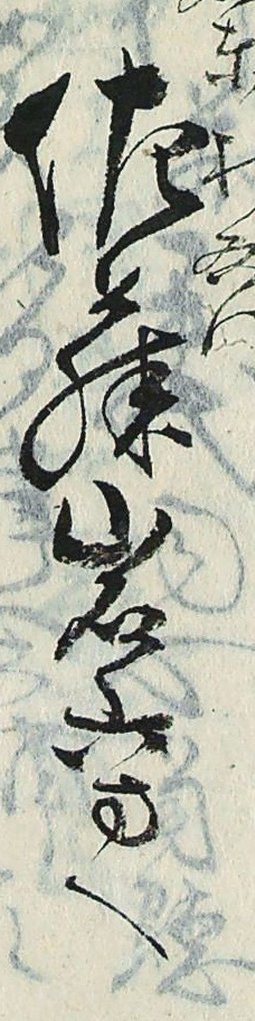佐藤岩六方へ
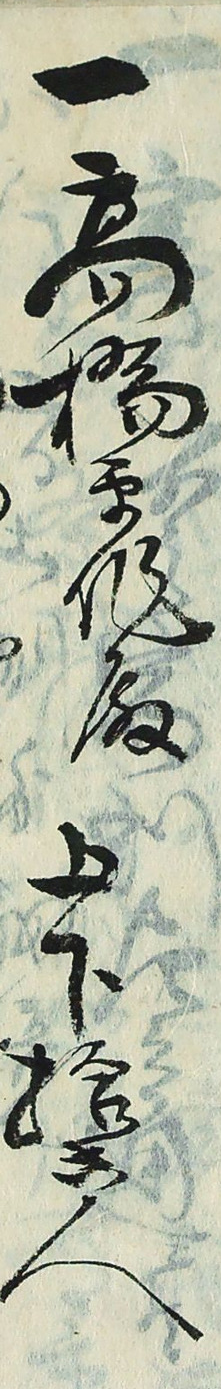一高橋平作殿上下拾六人
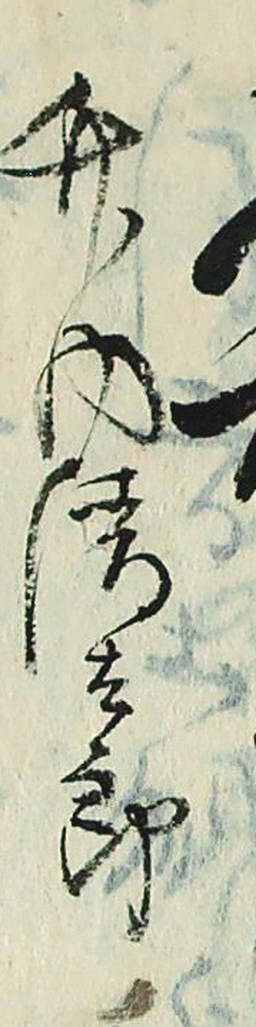竹内清太郎
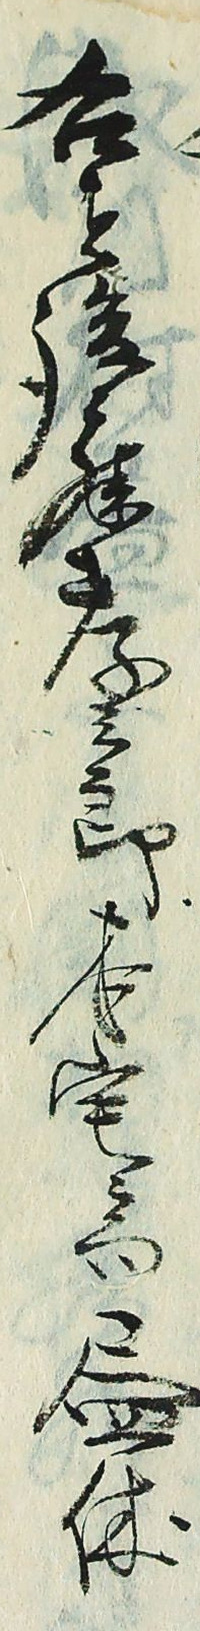右は後藤孝三郎本宅にて昼休
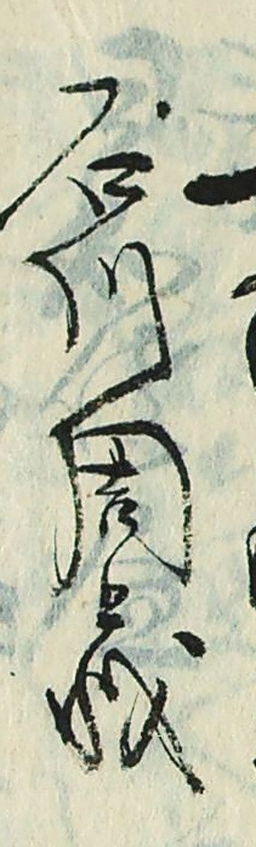石川周蔵
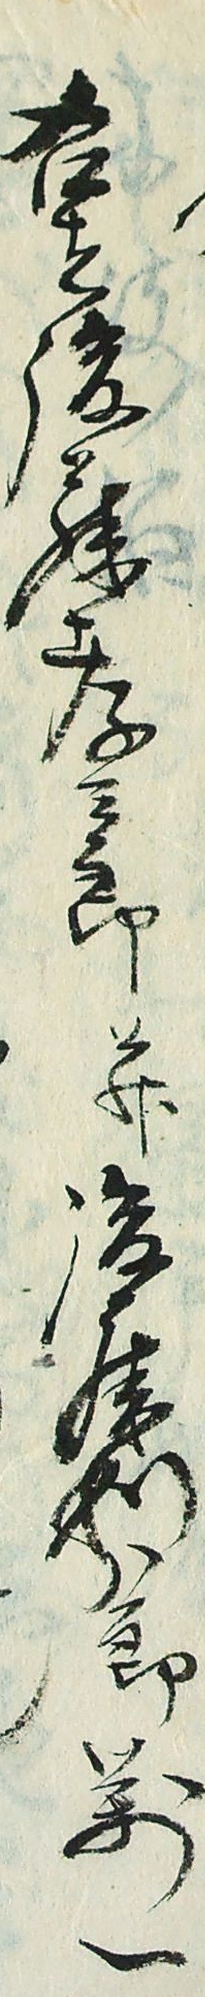右は後藤孝三郎并後藤利八郎万一
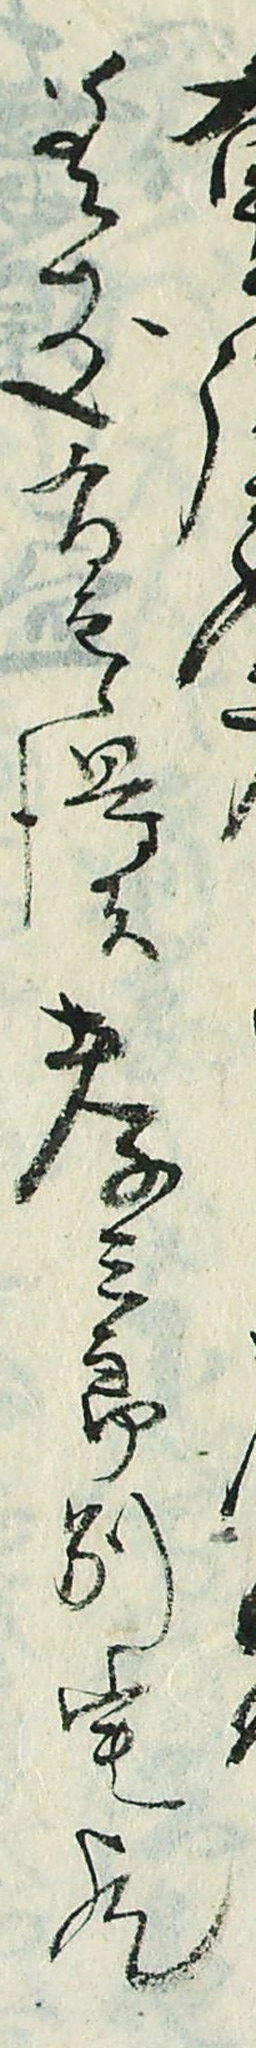差支有之候得は孝三郎別宅歟

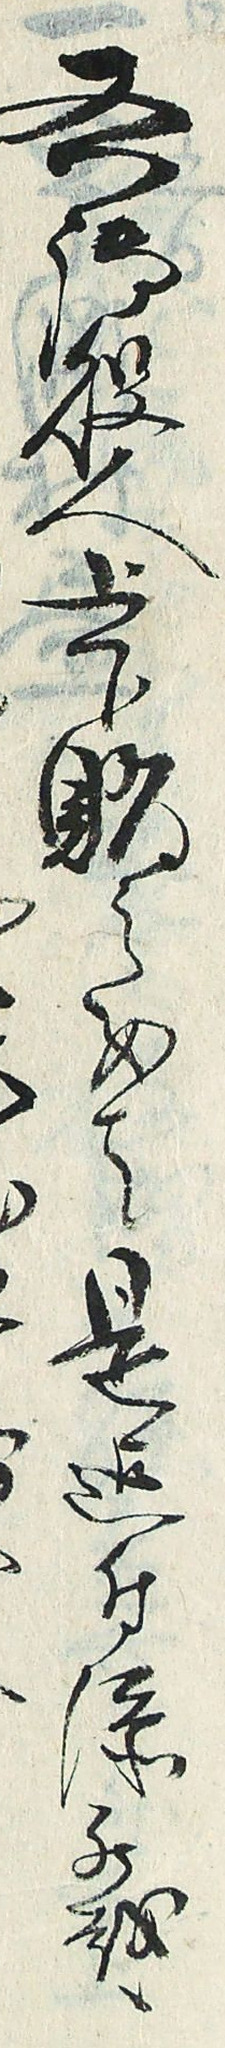右御役人上下賄之義は是迄付添罷越候
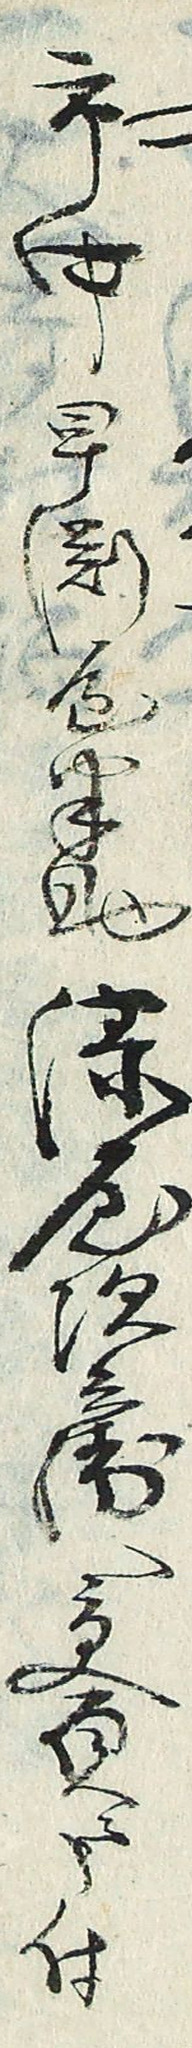市中早淵屋半助湊屋次兵衛へ受負に申付
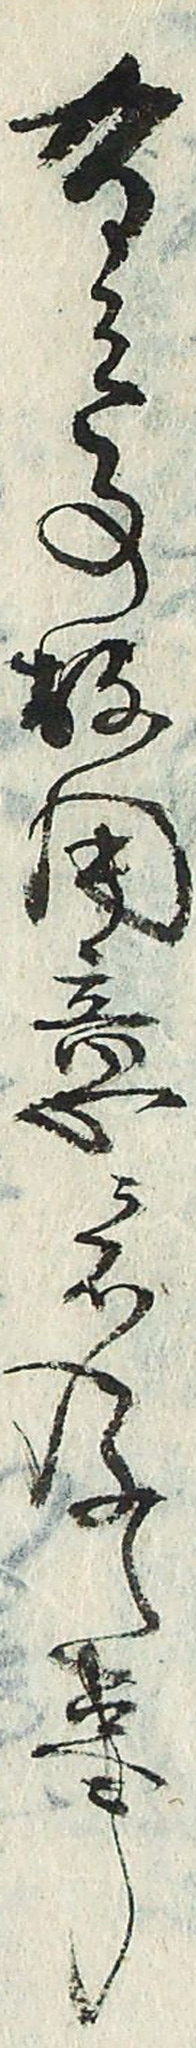有之事故用意に不及候事
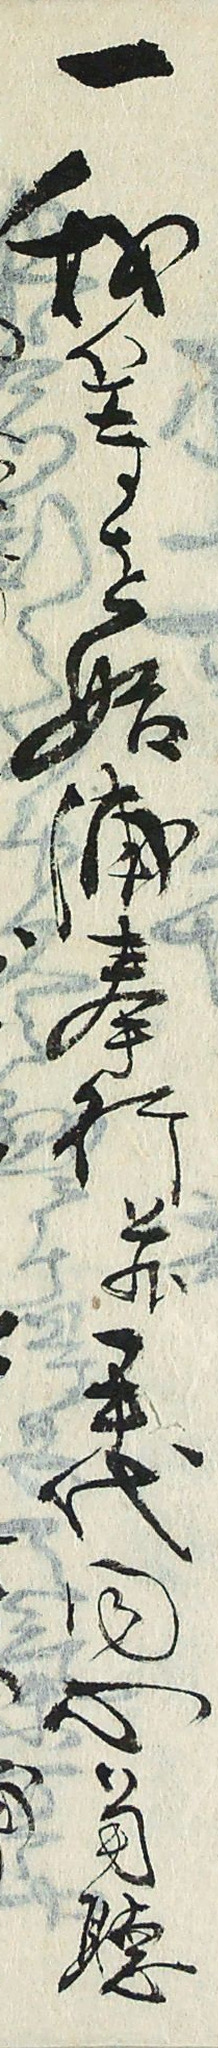一我等を始浦奉行并手代同心御用聴
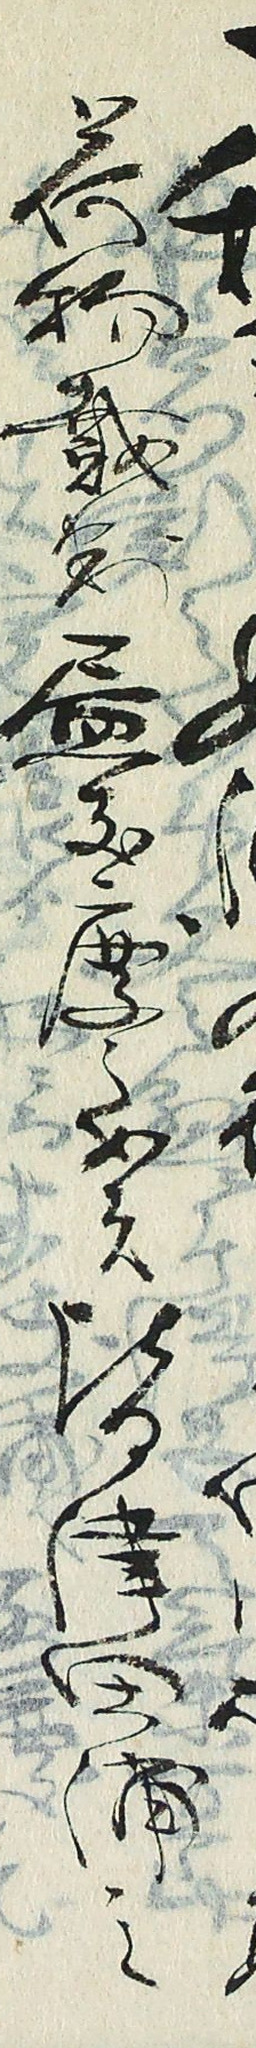荷物裁判昼支度之義は頃日津田浦之
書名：公辺御役人為御廻浦御立越諸御用一巻
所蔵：鳴門教育大学 Naruto University of Education
